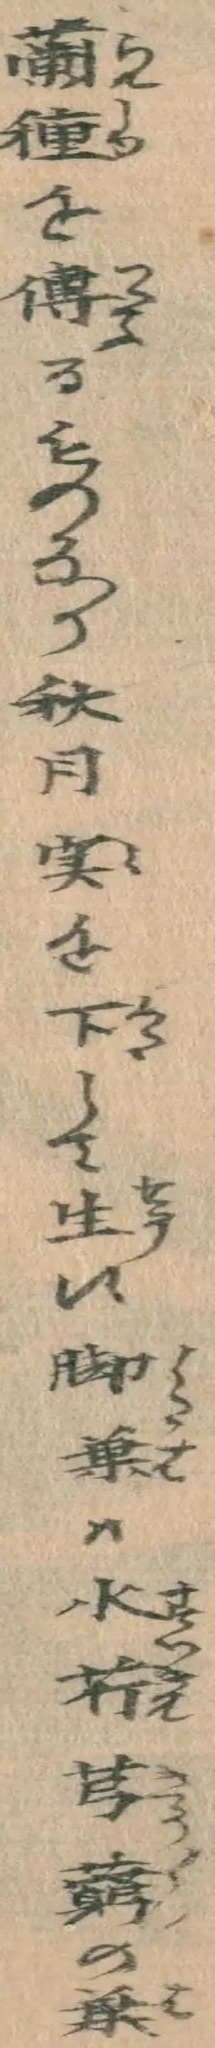蘭種を伝るものなり秋月実を下して生す脚葉は水芹芎藭の葉
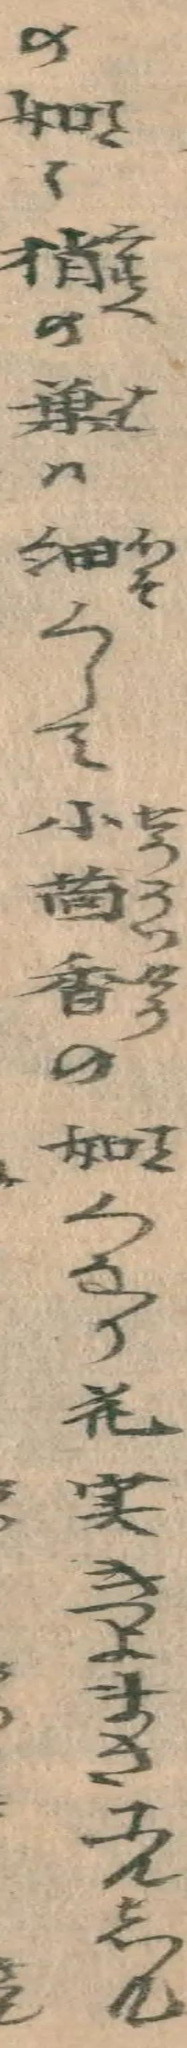の如く梢の葉は細くして小茴香の如くなり花実きよまさにんしん
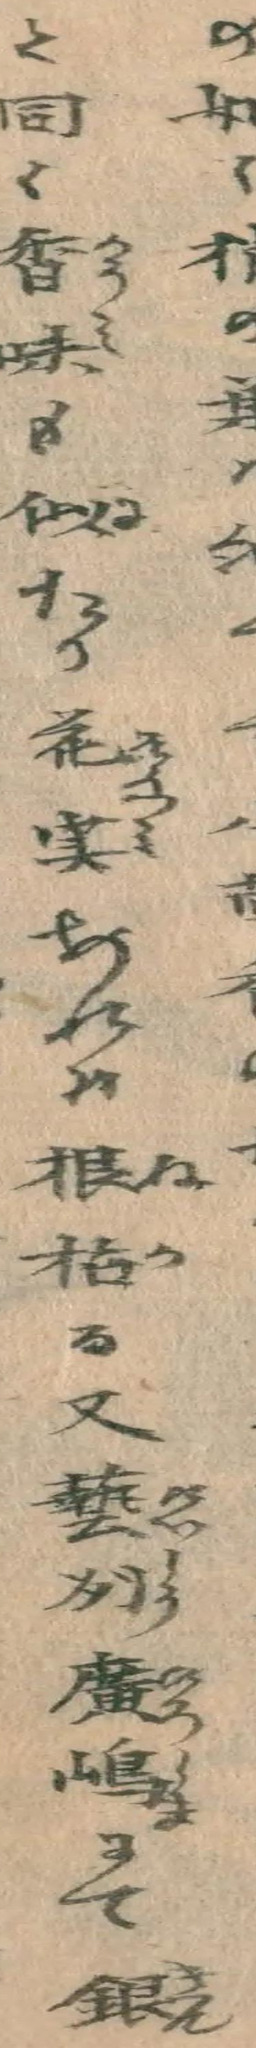と同く香味も似たり花実あれは根枯る又芸州広嶋にて銀
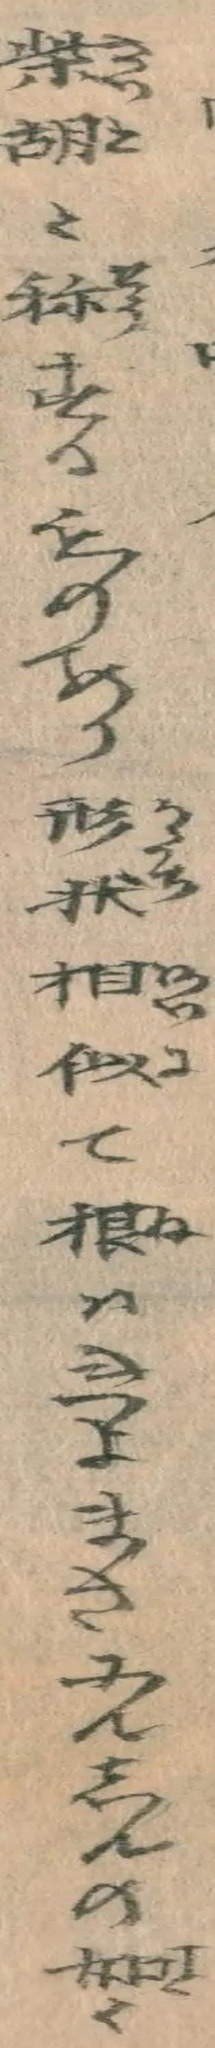柴胡と称するものあり形状相似て根はきよまさにんしんの如く
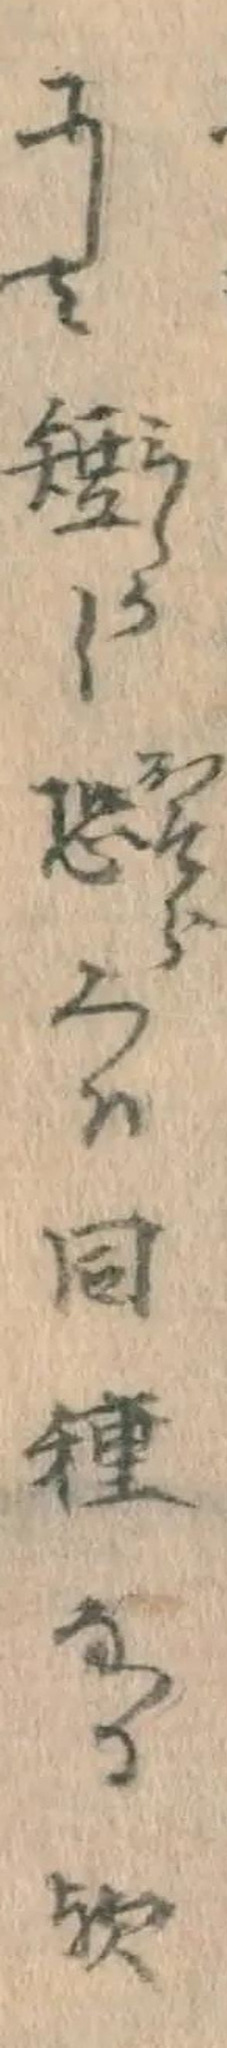にして短し恐くは同種なる歟

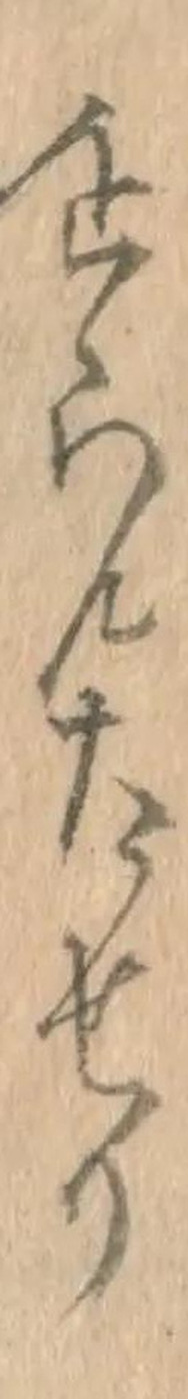をらんたせり

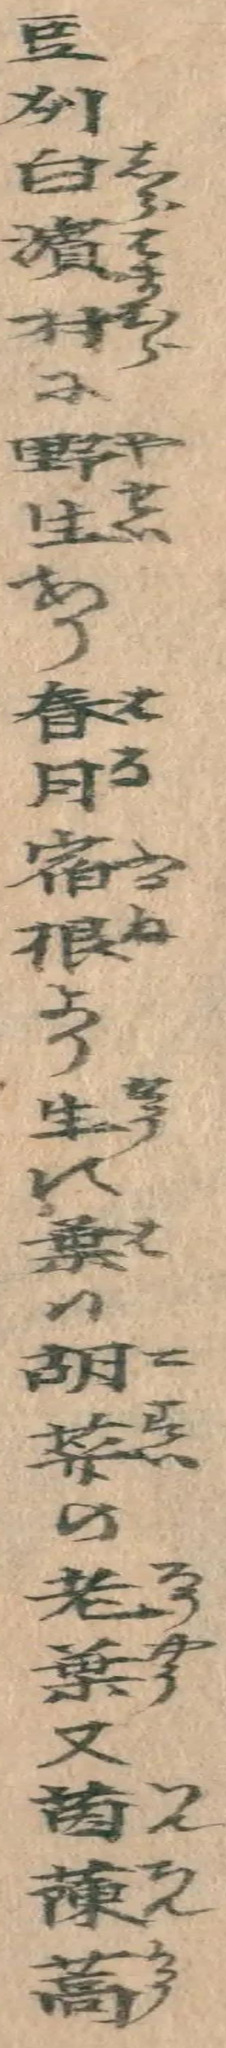豆州白浜村に野生あり春月宿根より生す葉は胡荽の老葉又茵蔯蒿
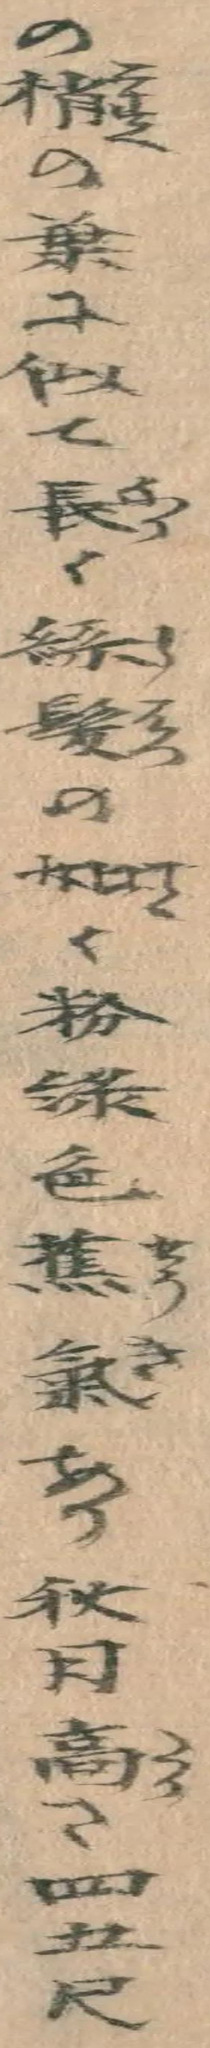の梢の葉に似て長く糸髪の如く粉緑色蕉気あり秋月高さ四五尺
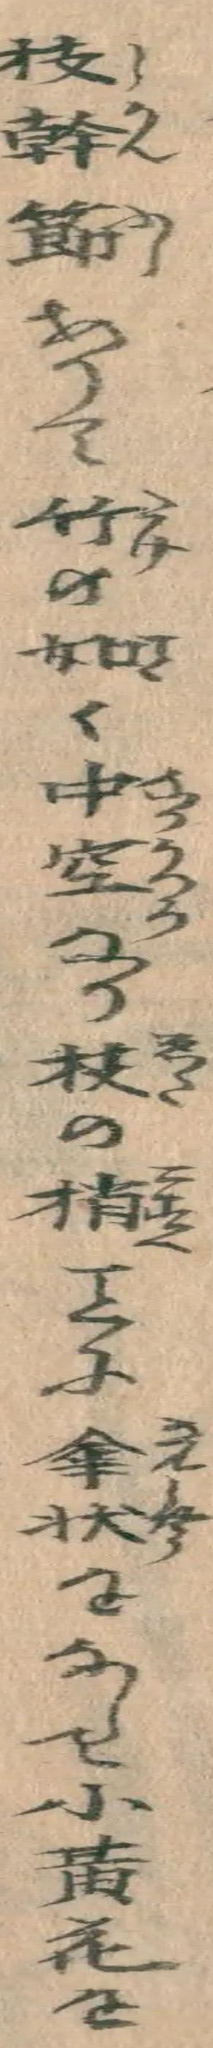枝幹節ありて竹の如く中空なり枝の梢ことに傘状をなして小黄花を
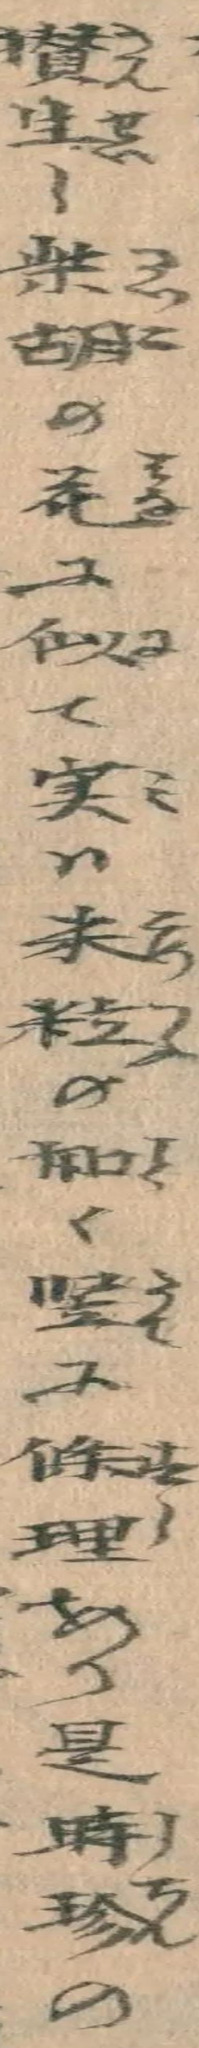攢生し柴胡の花に似て実は米粒の如く竪に条理あり是時珍の
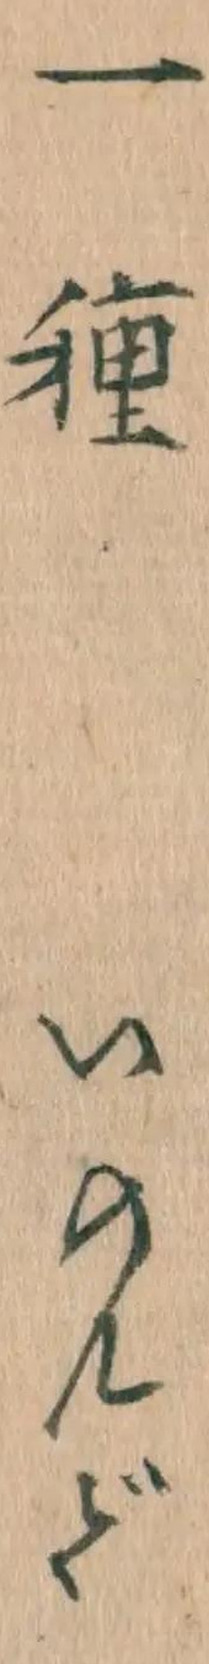一種いのんど
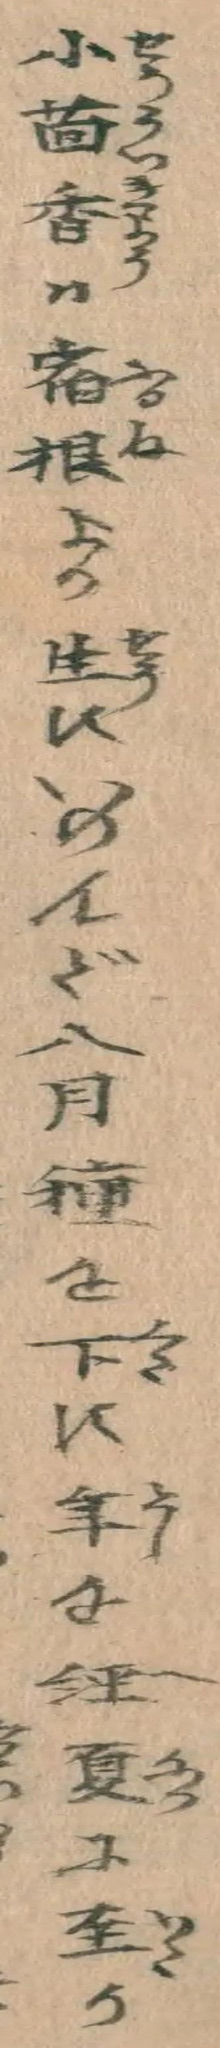小茴香は宿根より生すいのんど八月種を下す年を経夏に至り
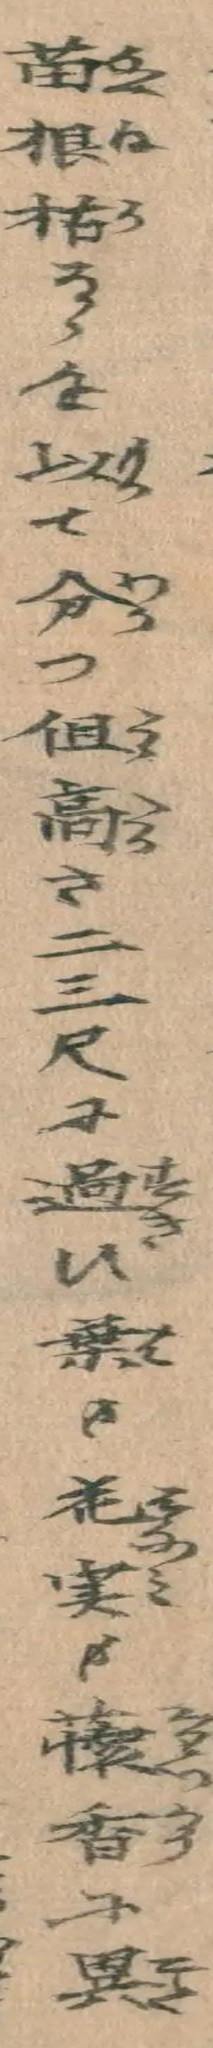苗根枯るゝを以て分つ但高さ二三尺に過す葉も花実も蘹香に異
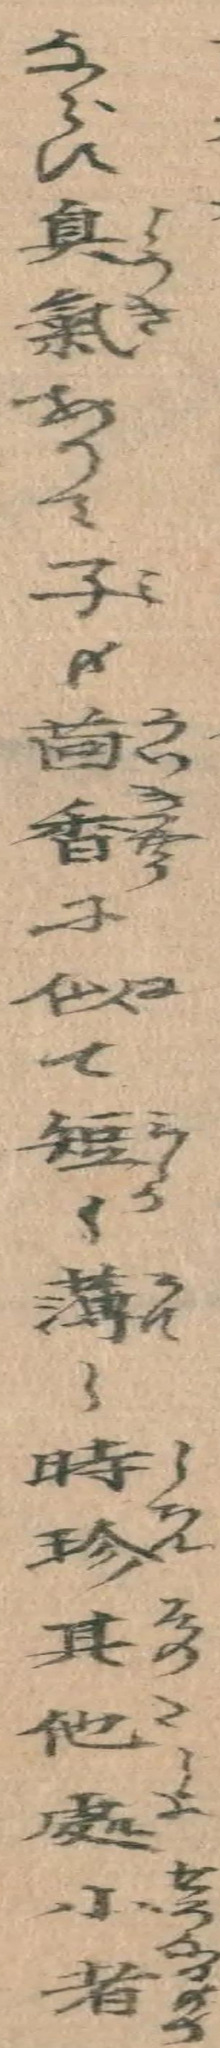ならす臭気ありて子も茴香に似て短く薄し時珍其他処小者

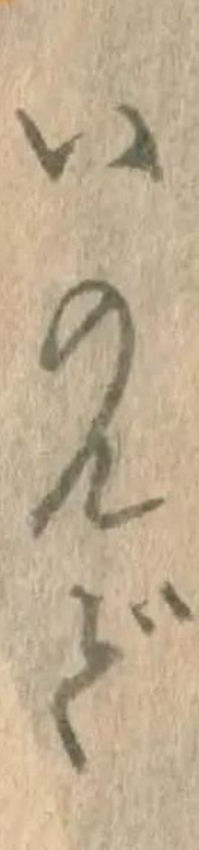いのんど
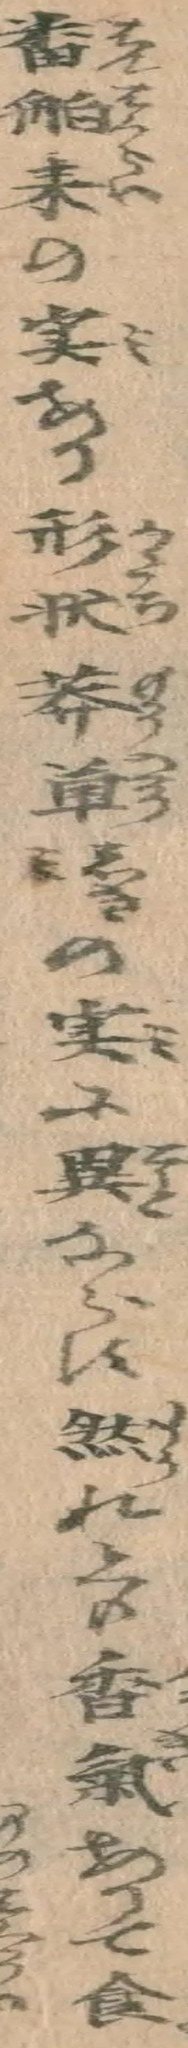畨舶来の実あり形状莽草しきみの実に異ならす然れとも香気ありて食
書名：本草図譜. 巻46-48
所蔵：国立国会図書館 National Diet Library, JAPAN
